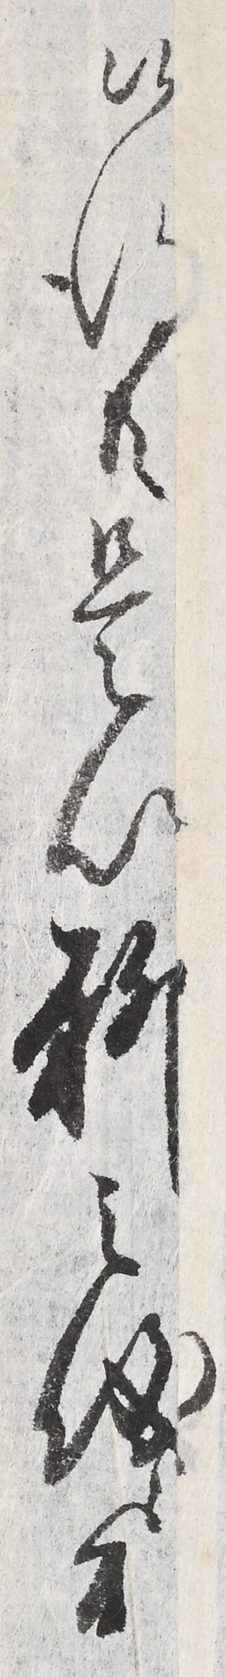候得共是以聊之儀ニ付
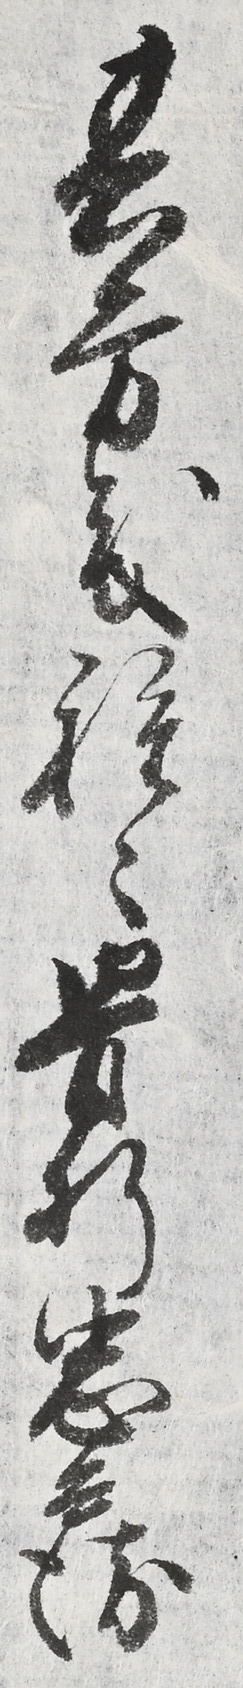其方義種々骨折忠兵衛
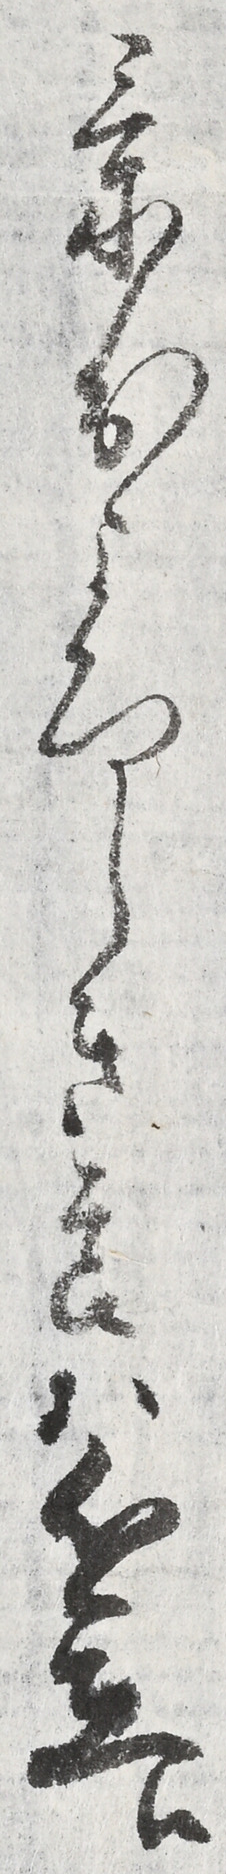気分よろしき節ハ近在え
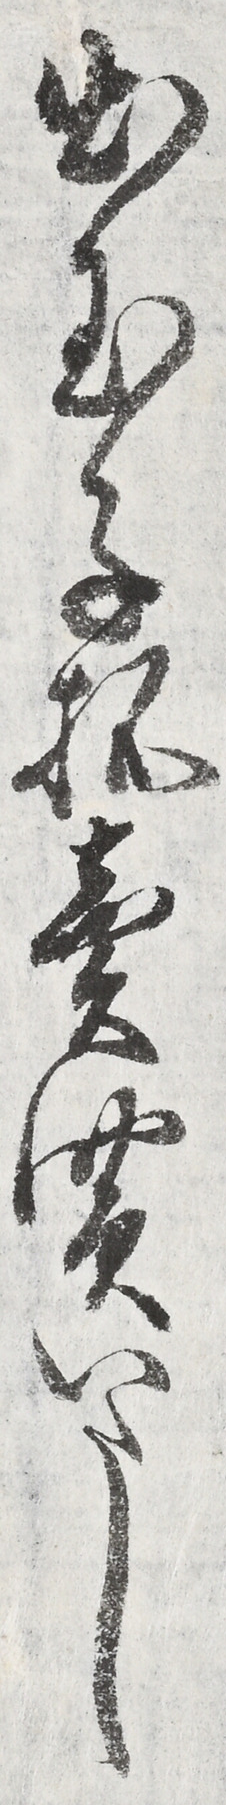出玉子抔売買いたし
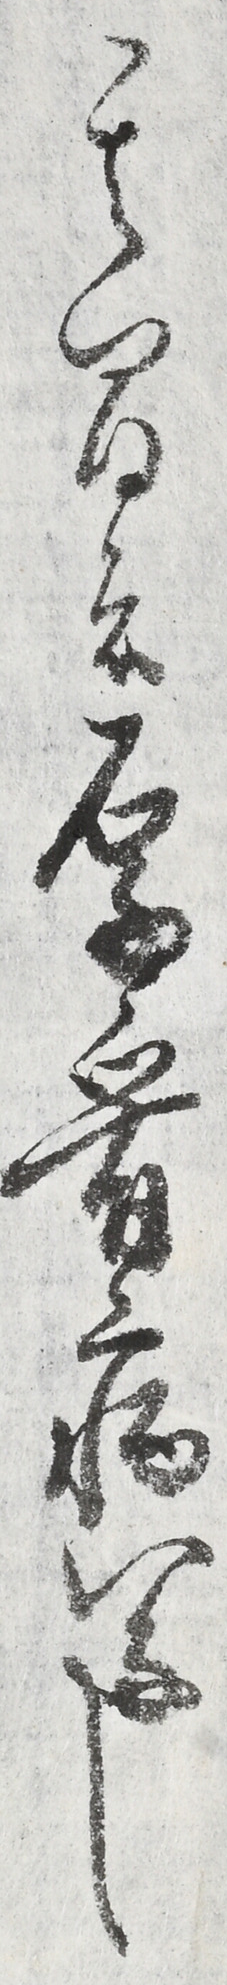其間は厚看病いなし

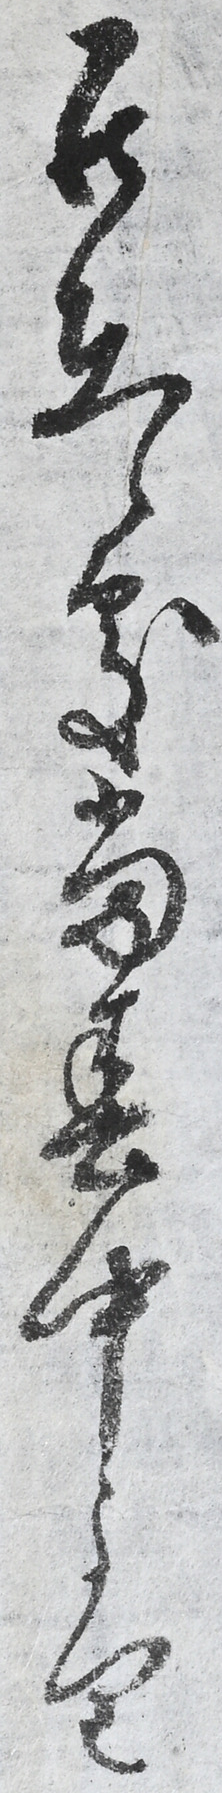罷在候処当春中より
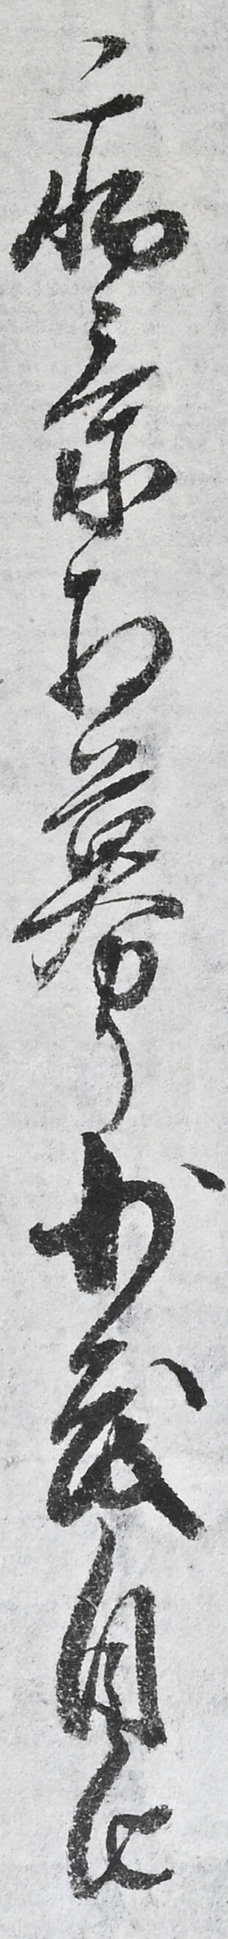病気相募り少も自由
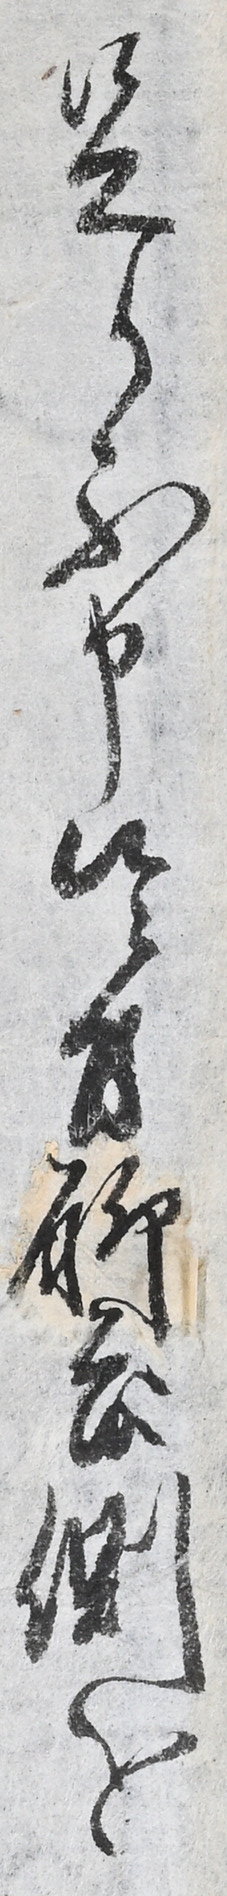足り不申候ニ付聊も側を
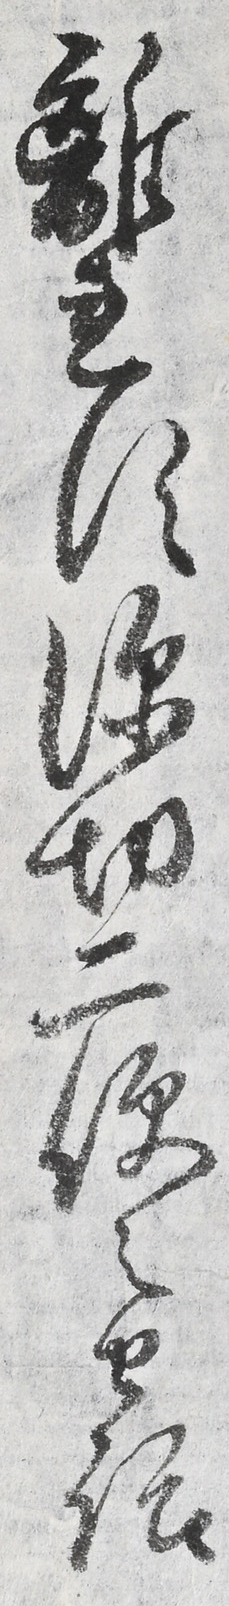離れす深切二便之セ話
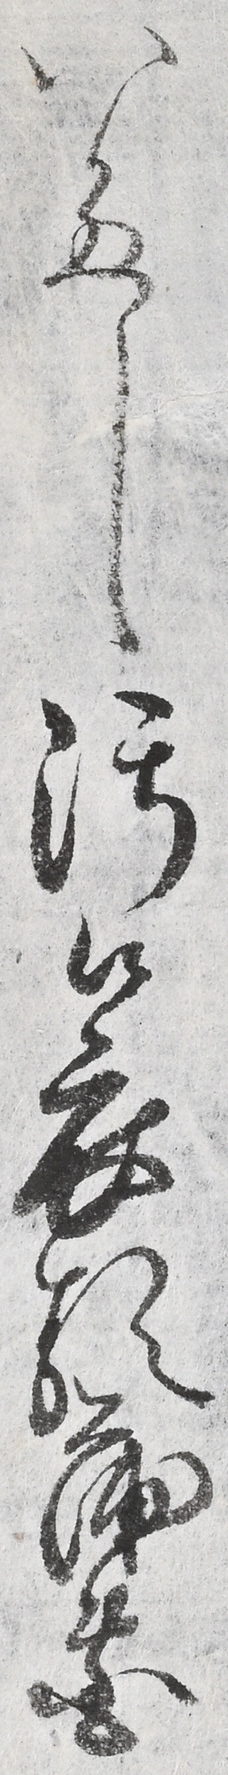いたし汚候衣類蒲団
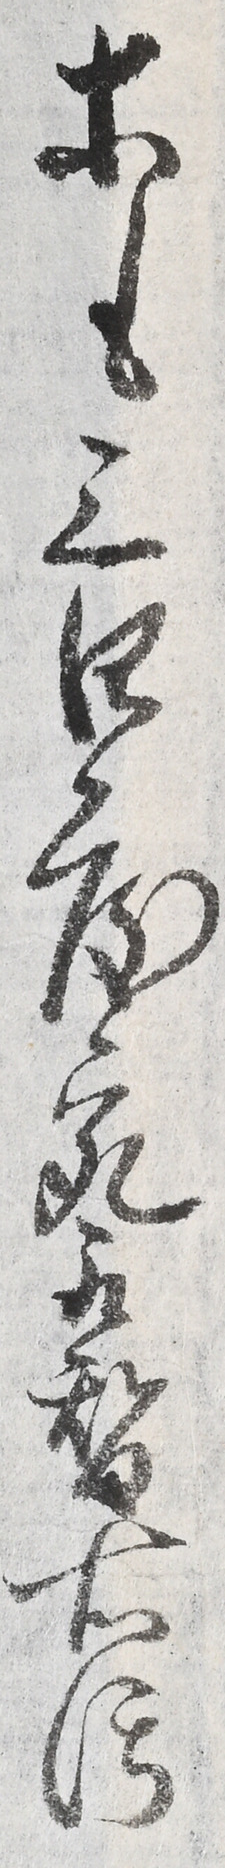等も三四度宛取替右汚
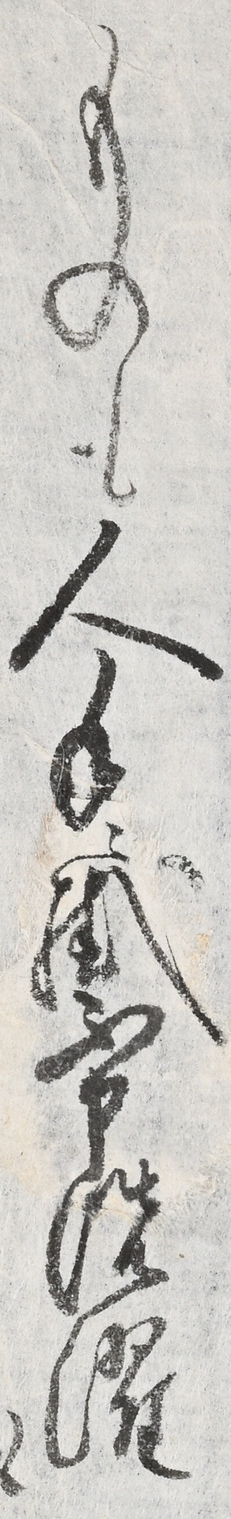ものも人手掛不申洗濯も
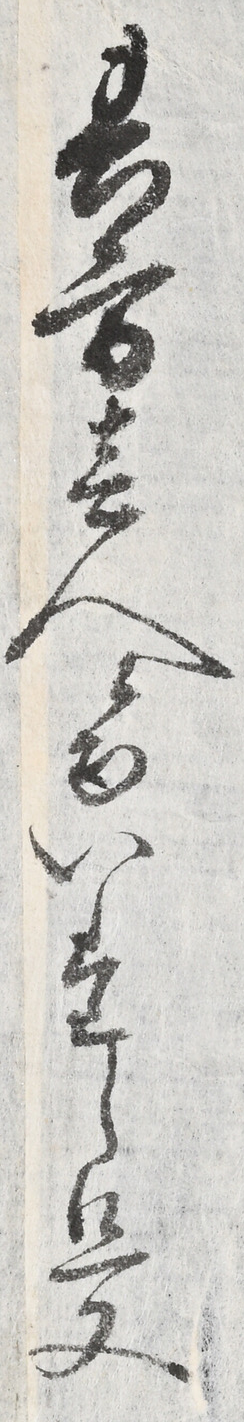其方壱人ニ而いたし且又
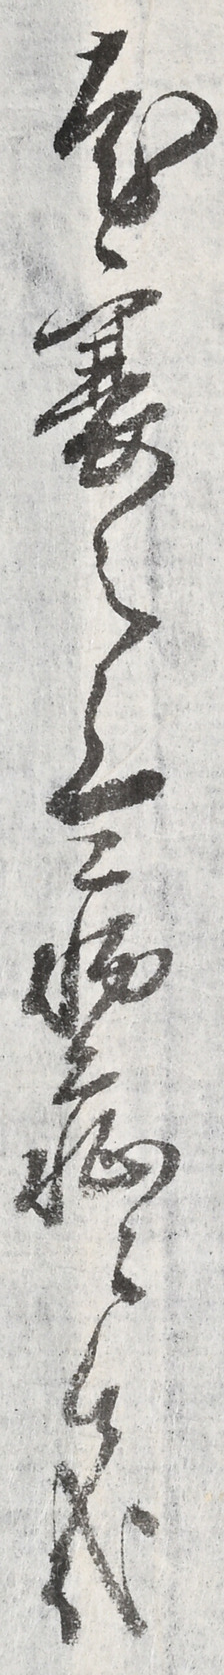老衰之上病症ニ候哉
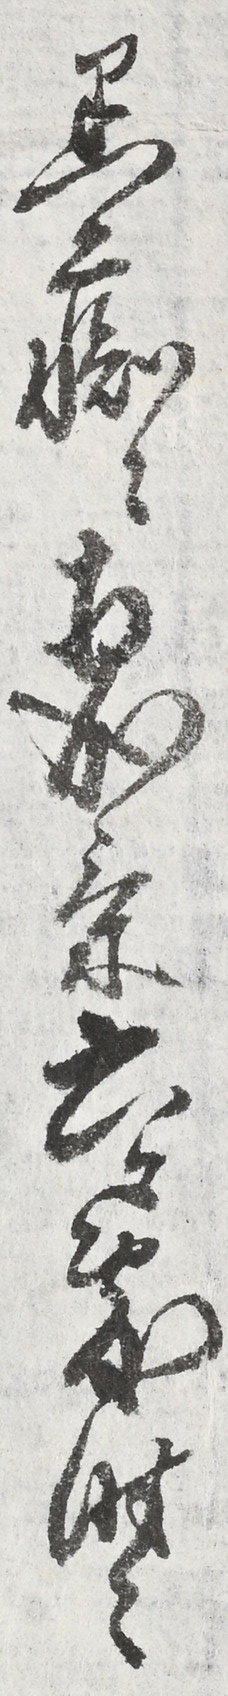痴ニ相成気六ケ敷時々

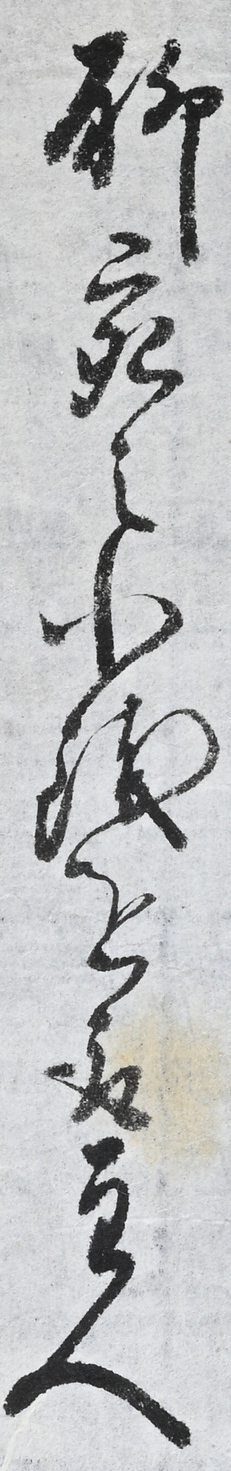聊宛之小銭を取主人
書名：（書付）
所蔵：伊那市立高遠町図書館・合同会社AMANE
